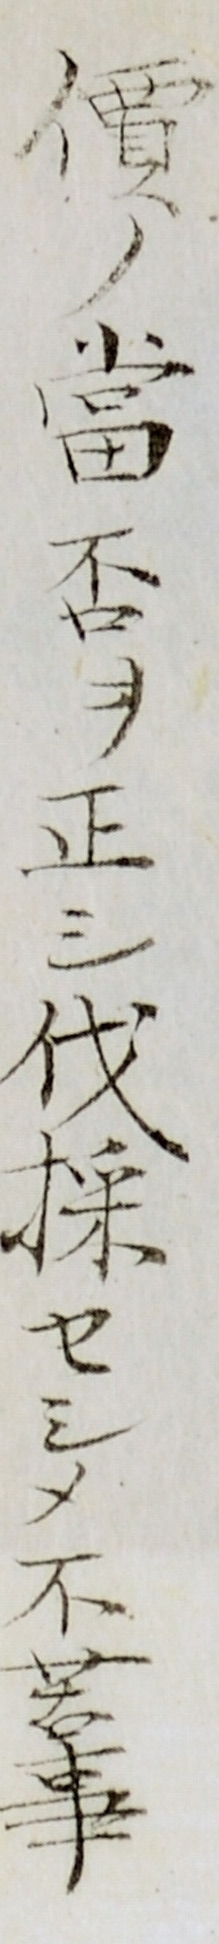価ノ当否ヲ正シ伐採セシメ不苦事
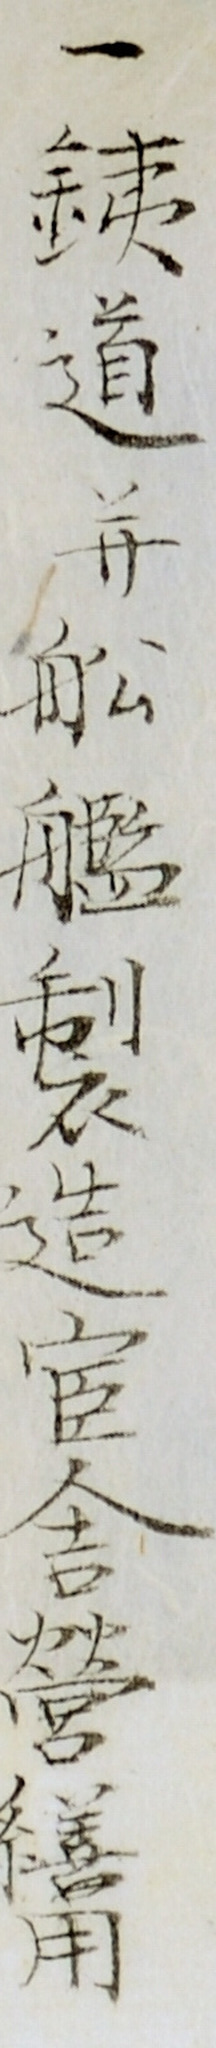一鉄道幷船艦製造官舎営繕用
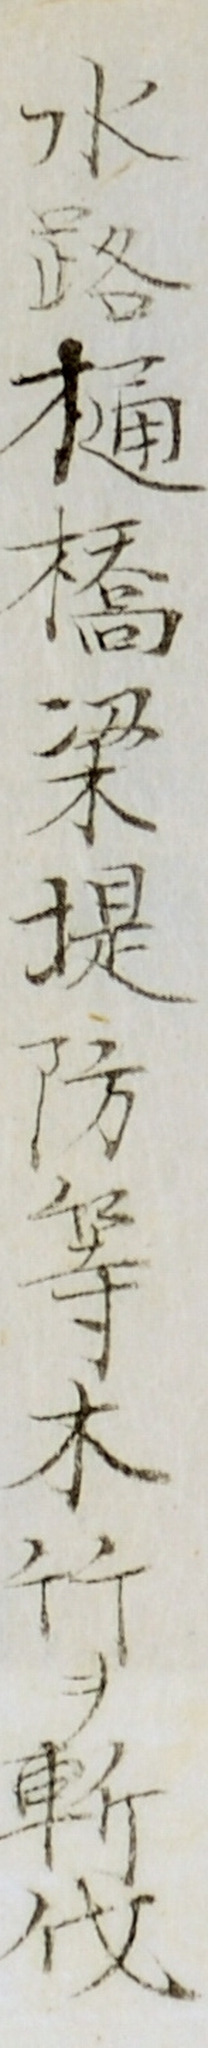水路樋橋梁堤防等木竹ヲ斬伐
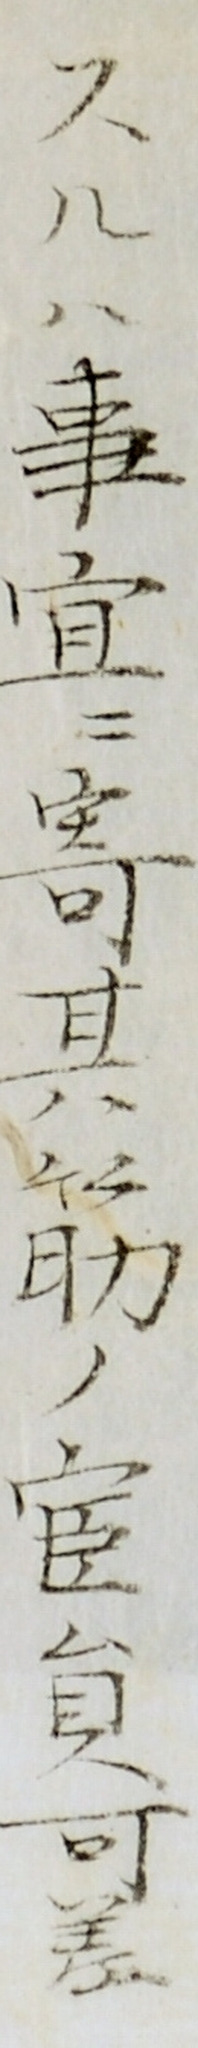スルハ事宜ニ寄其筋ノ官員可差
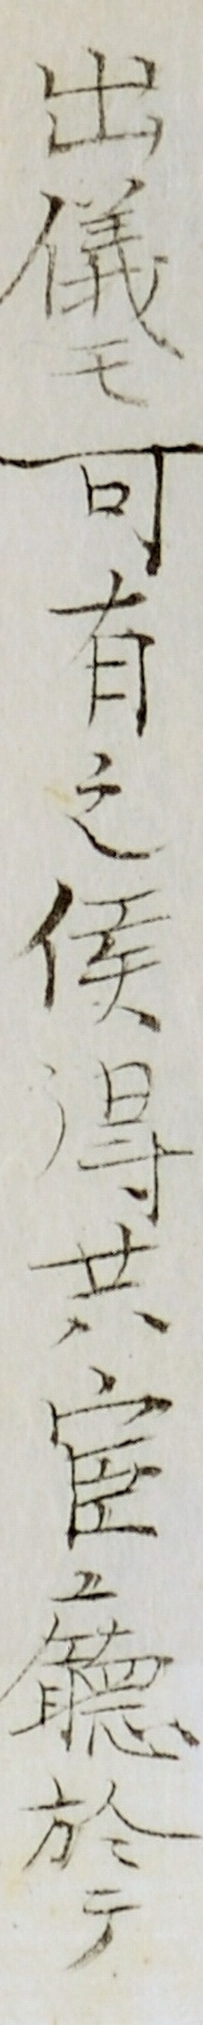出儀モ可有之候得共官庁於テ
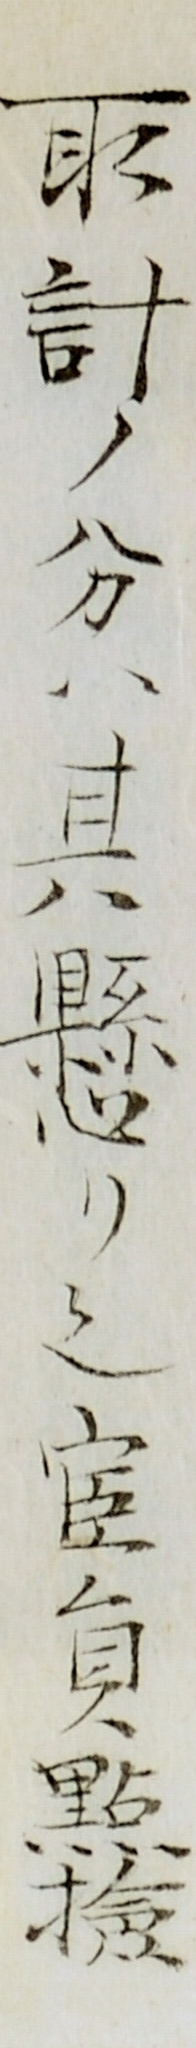取計ノ分ハ其懸リ之官員点検
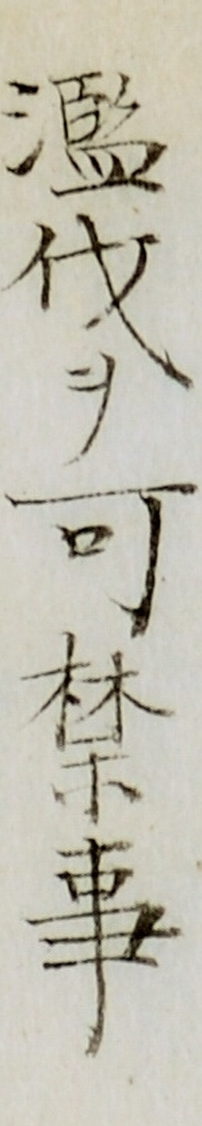濫伐ヲ可禁事
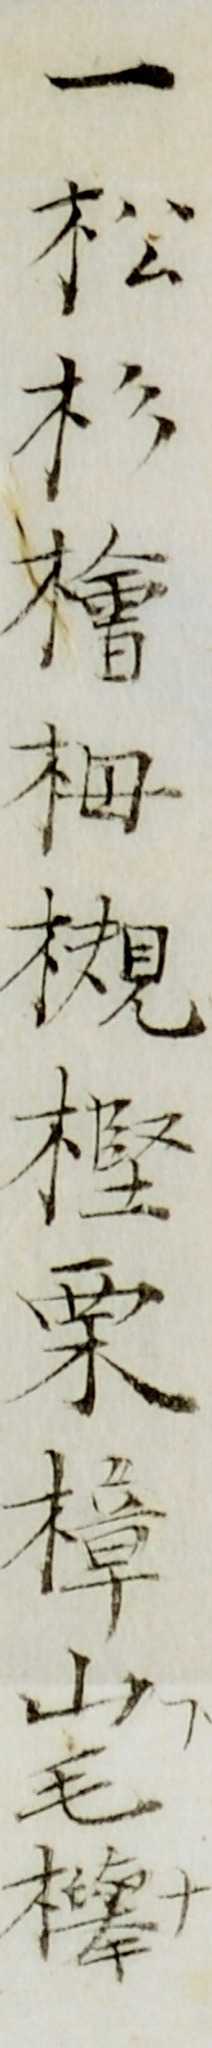一松杉檜栂槻樫栗樟山毛欅
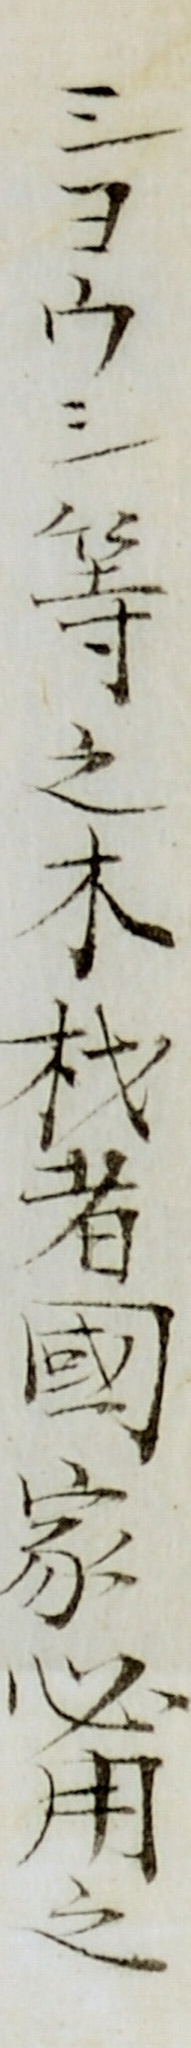シヨウシ等之木材者国家必用之
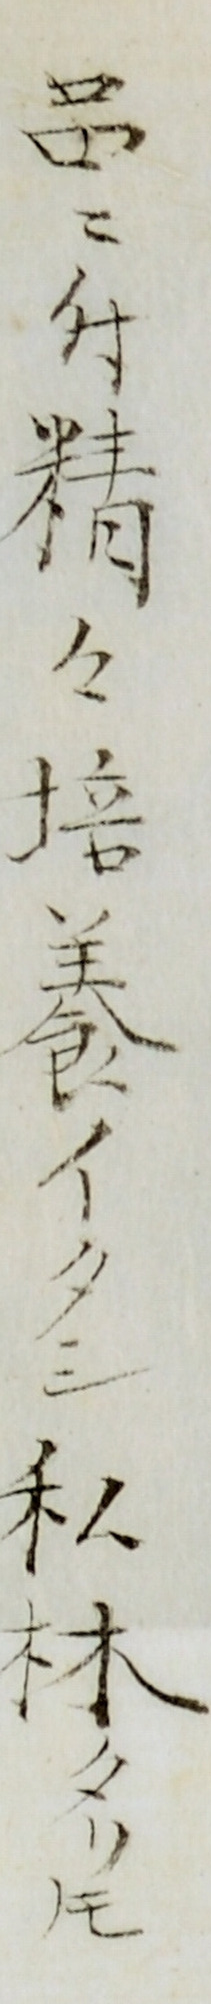品ニ付精々培養イタシ私林タリトモ
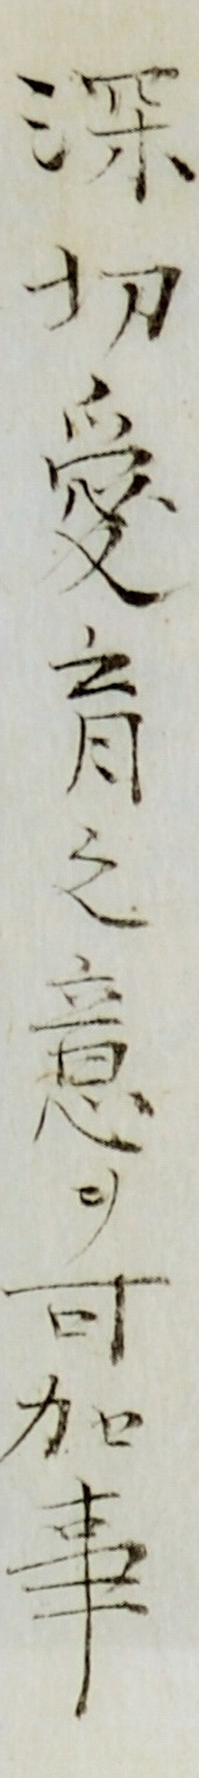深切愛育之意ヲ可加事

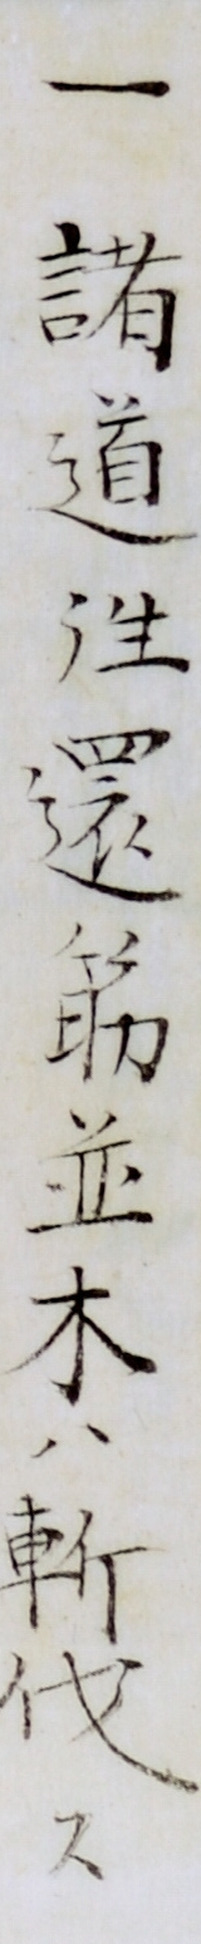一諸道往還筋並木ハ斬伐ス
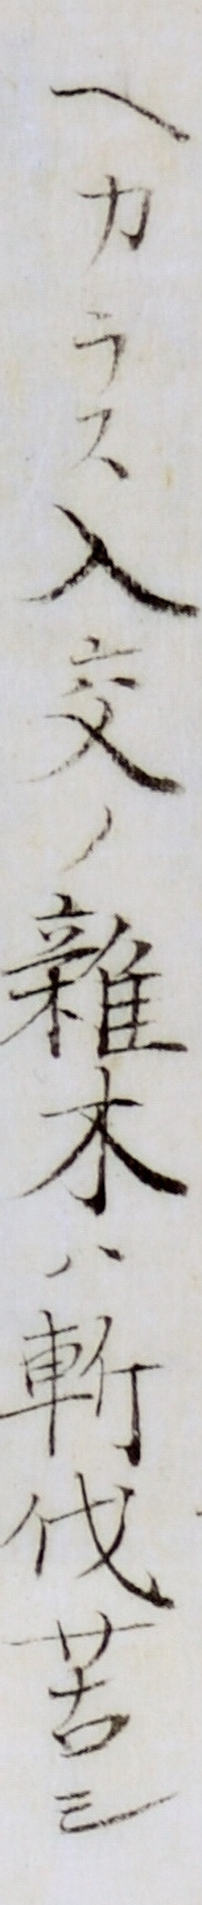ヘカラス入交ノ雑木ハ斬伐苦シ
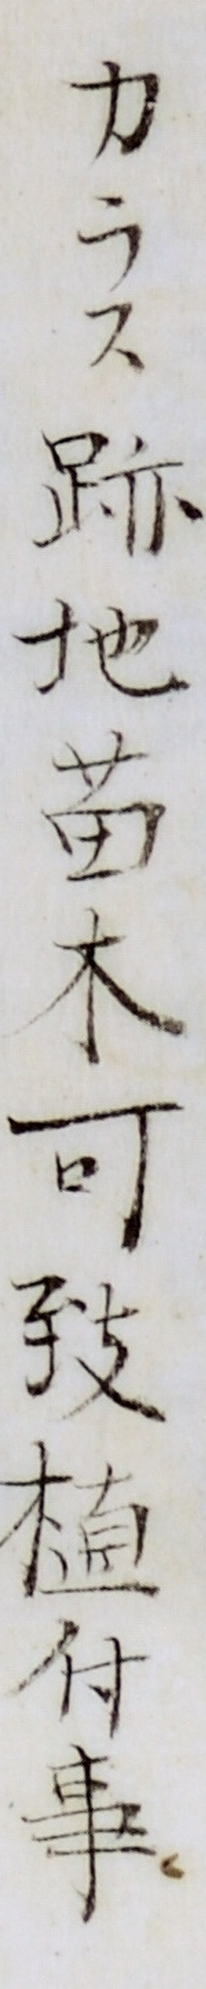カラス跡地苗木可致植付事
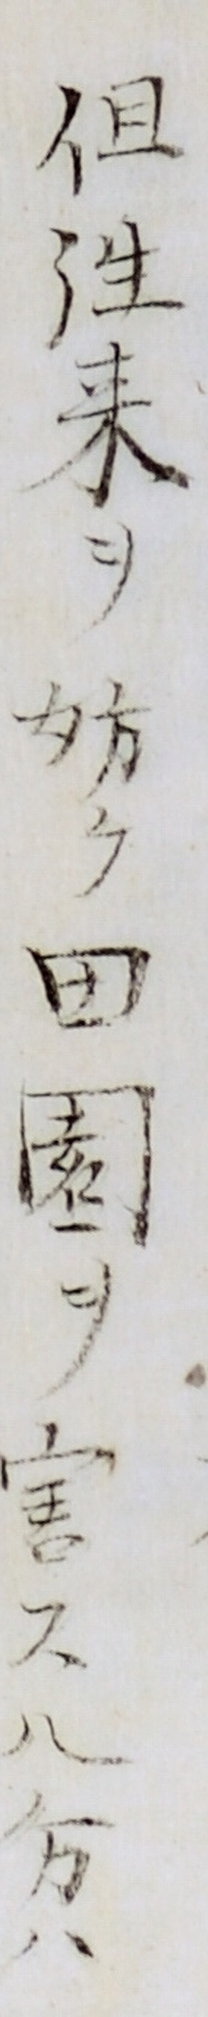但往来ヲ妨ケ田園ヲ害スル分ハ
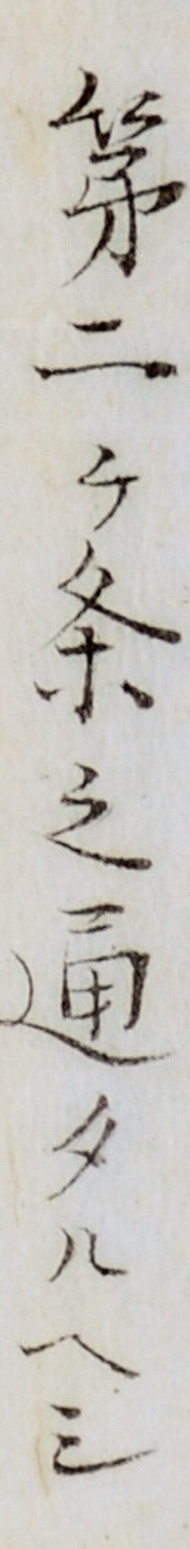第二ヶ条之通タルヘシ
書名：山林方諸事御用留
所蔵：伊那市立高遠町図書館・合同会社AMANE
